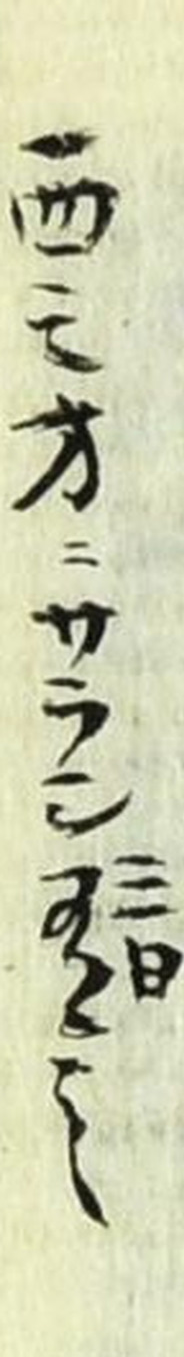西之方ニサラシ有之
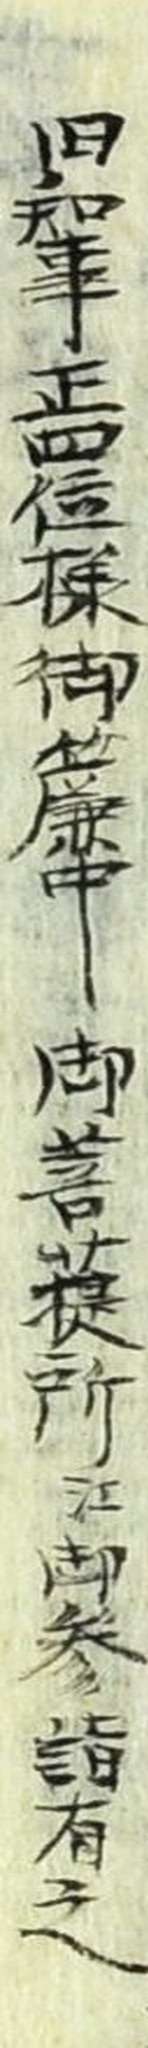旧知事正四位様御簾中御菩提所江御参詣有之
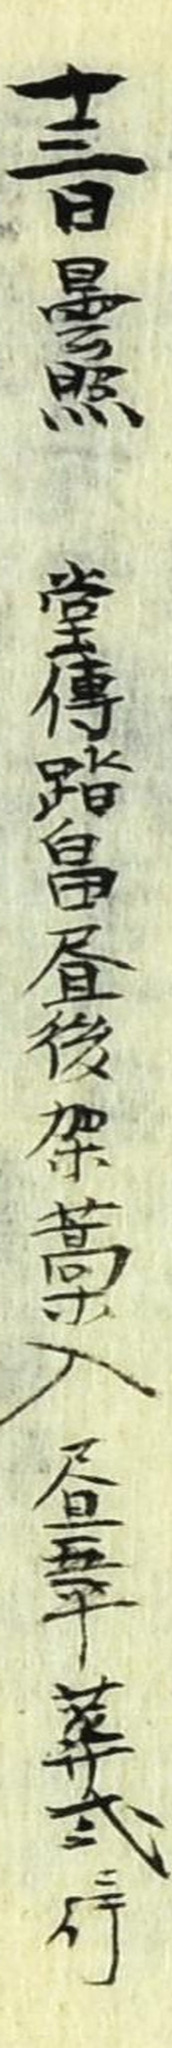十三日曇照堂伝踏畠昼後架藁入昼五平葬式ニ行
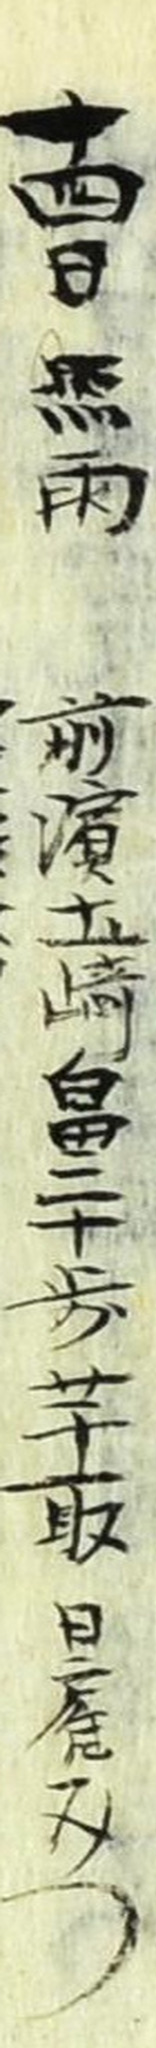十四日照雨前浜土崎畠二十歩芋取日雇みつ
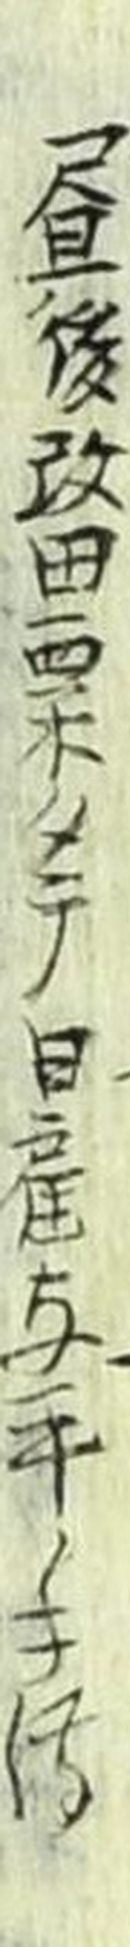昼後改田粟タテ日雇与平手伝
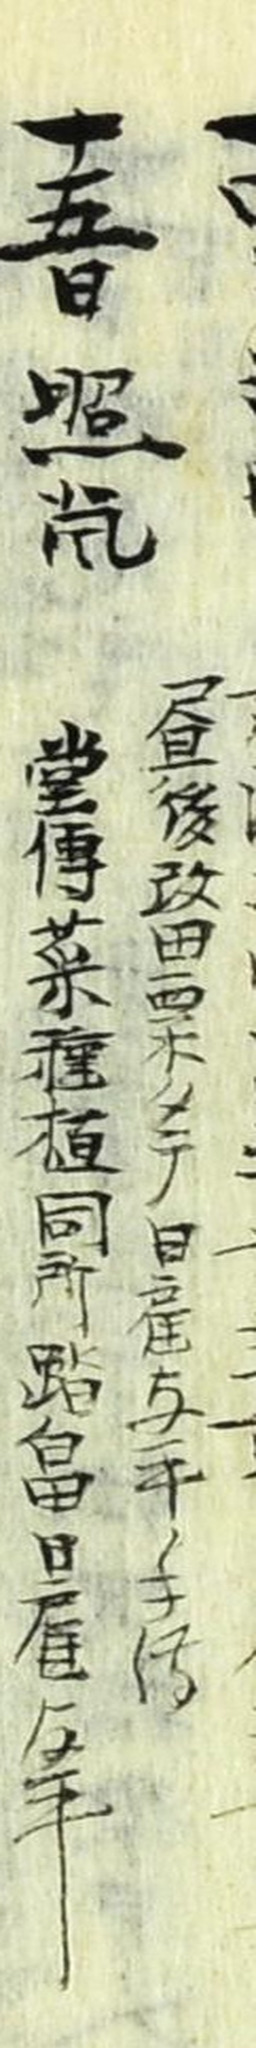十五日照嵐堂伝菜種植同所踏畠日雇与平
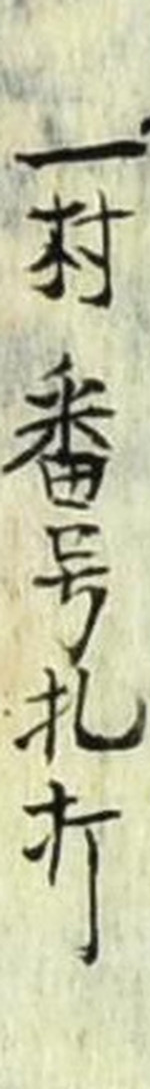一村番号札打
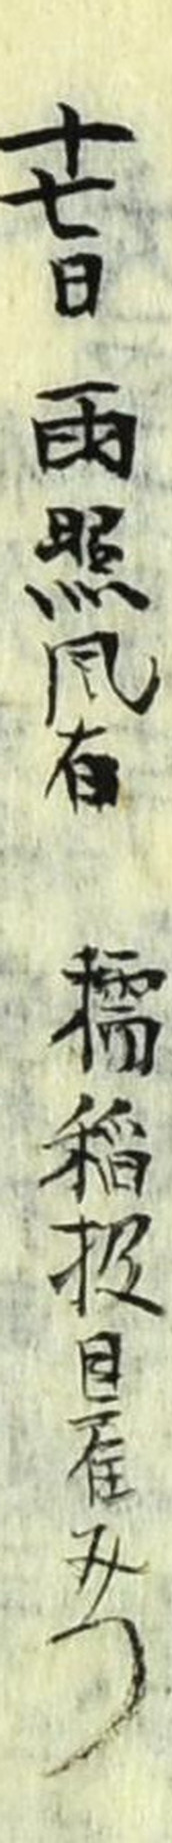十七日雨照風有糯稲扱日雇みつ
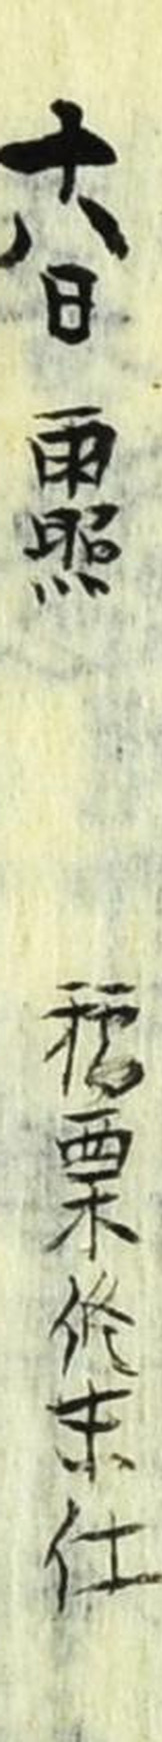十八日雨照糯粟修末仕
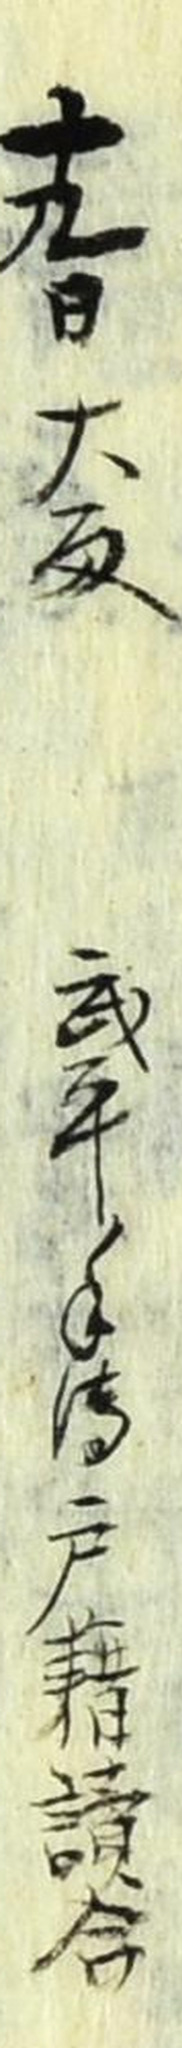十九日大雨武平手伝戸籍読合
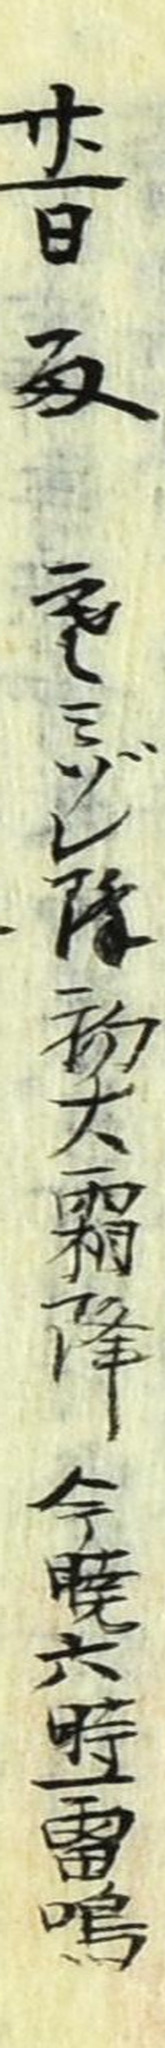廿一日雨寒ミゾレ降初大霜降今暁六時一雷鳴
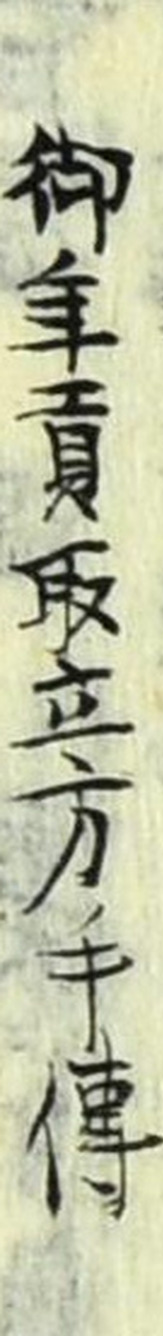御年貢取立方手伝

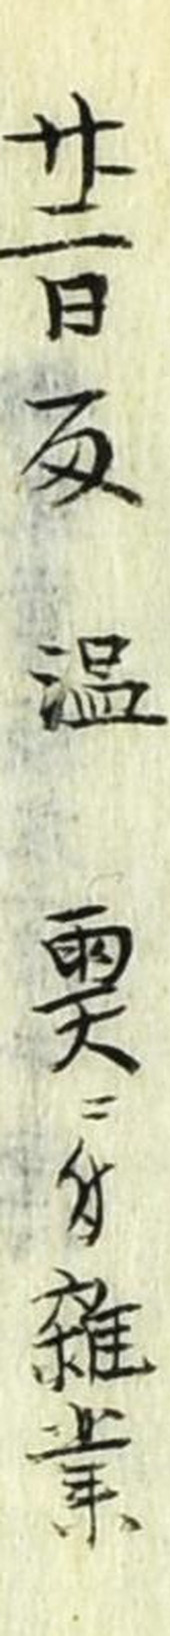廿二日雨温雨天ニ付雑業
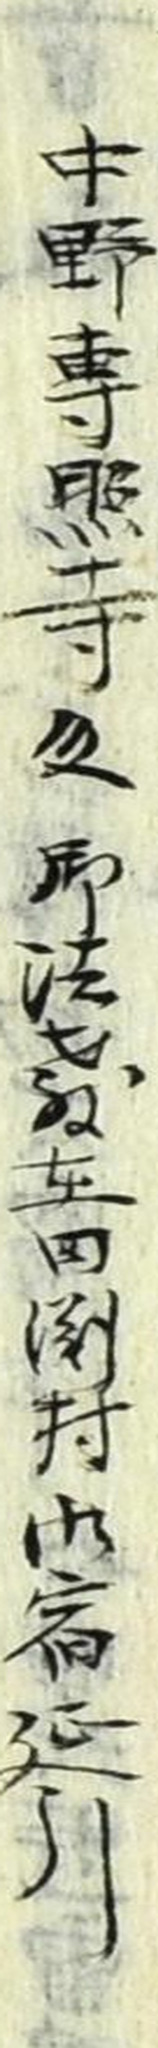中野専照寺殿御法教在田淵村御宿延引
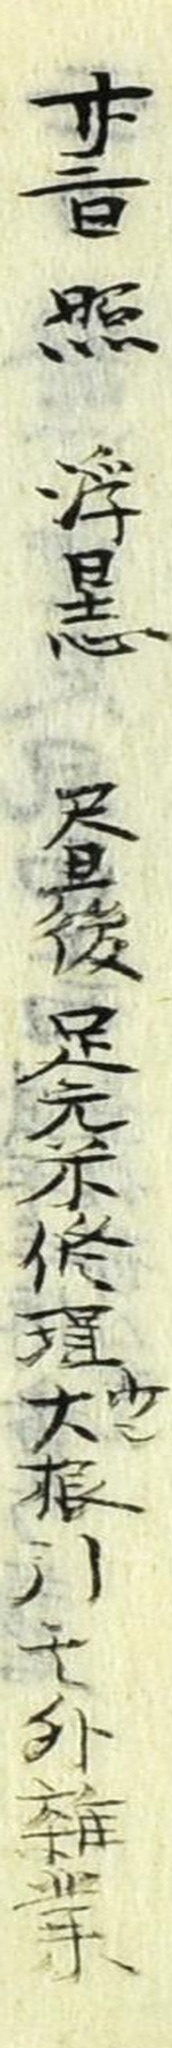廿三日照浮日志昼後足元米修理少し大根引其外雑業
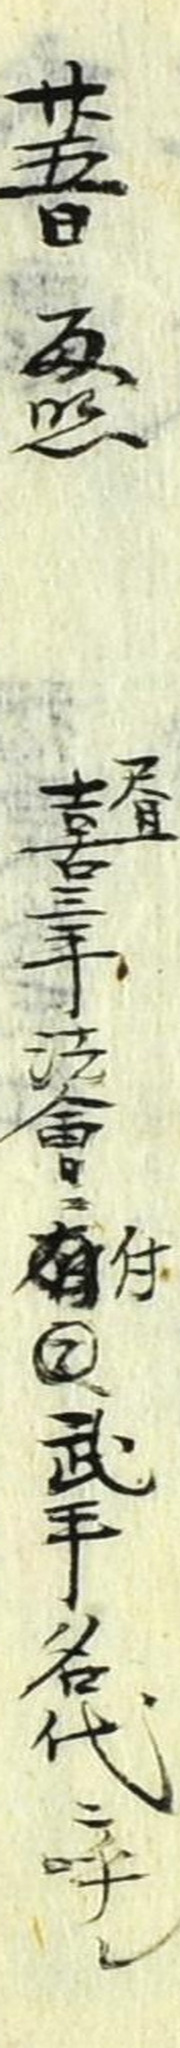廿五日雨照喜三平法会ニ付武平名代ニ呼レ
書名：（日記）
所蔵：福井県文書館 Fukui Prefectural Archives
